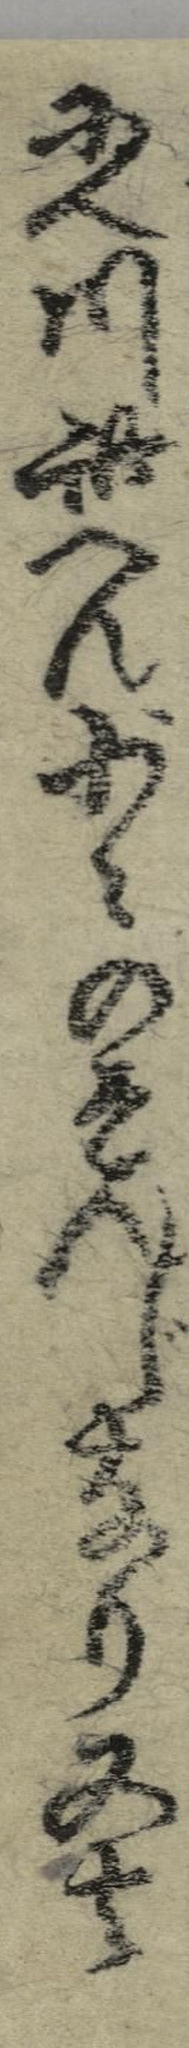にへ川此へん少々のそんじはかり又は
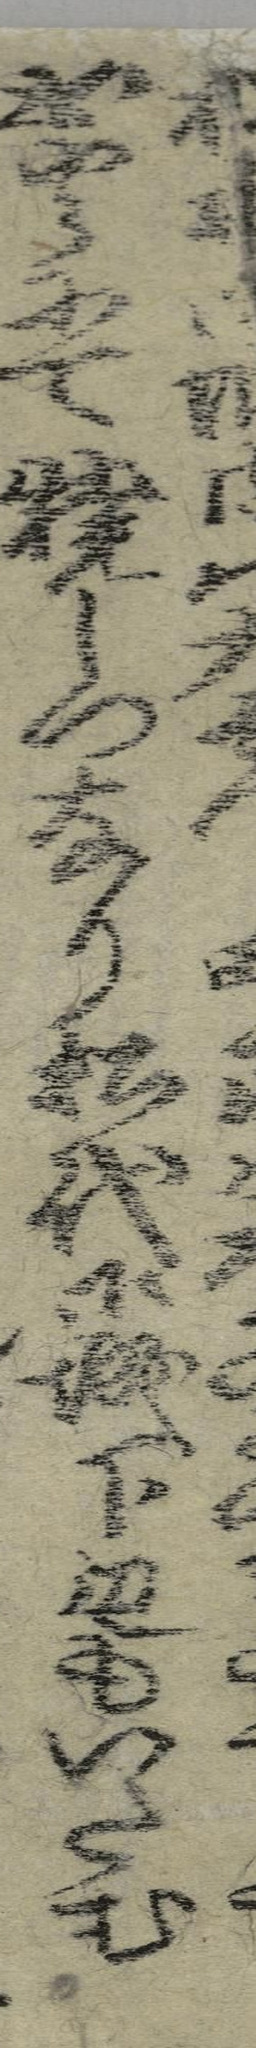出火にて焼しつなり松代御城下辺もいたむ小原
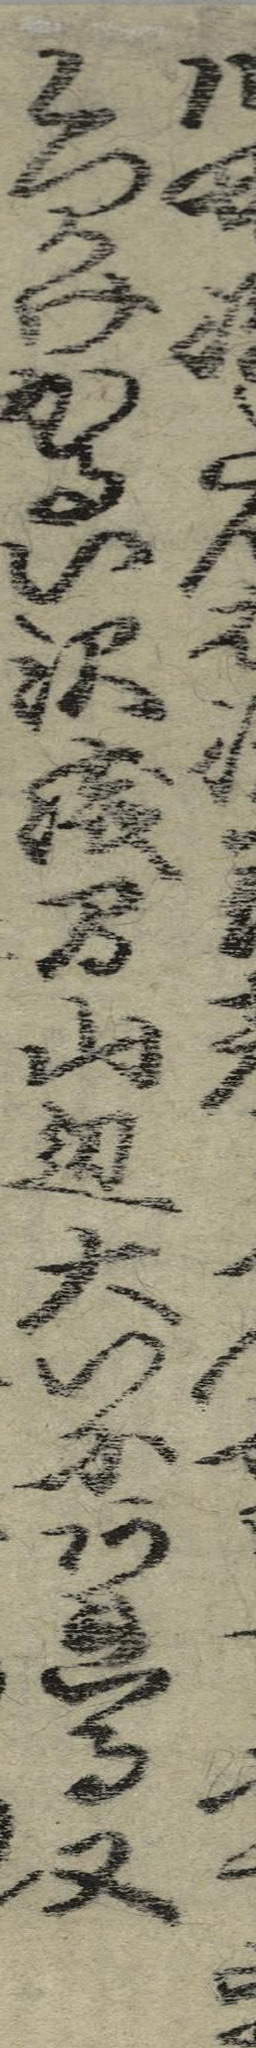くつかけかるい沢浅間山辺大いにあれる又安中
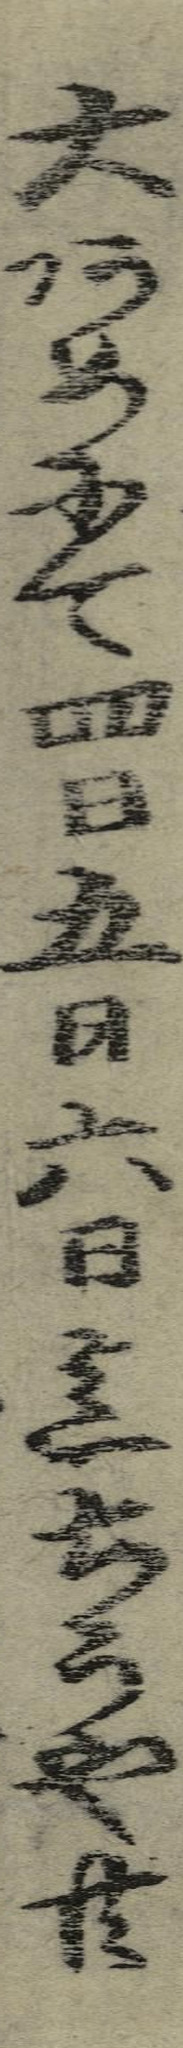大あめにて四日五日六日迄ちうや共
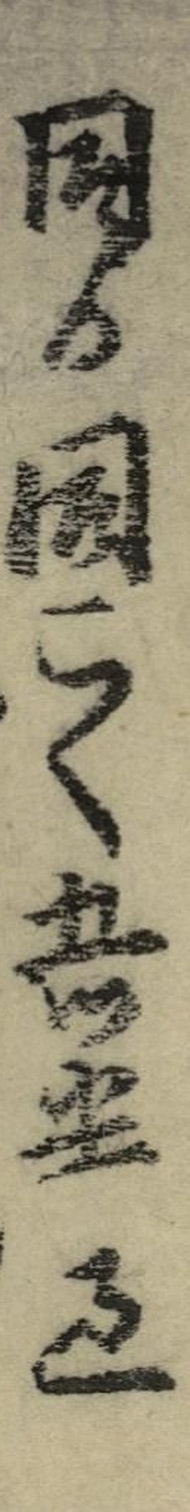同日同こく五ッ半過
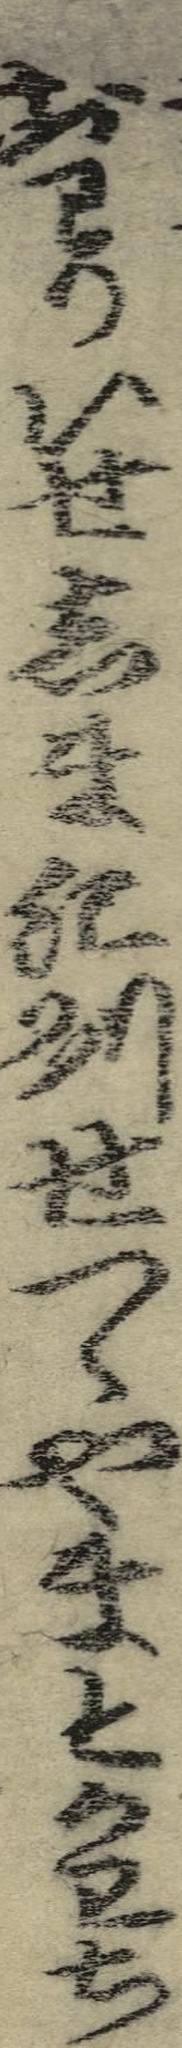むさしいせしま紀州せつやまとかわち宇都宮
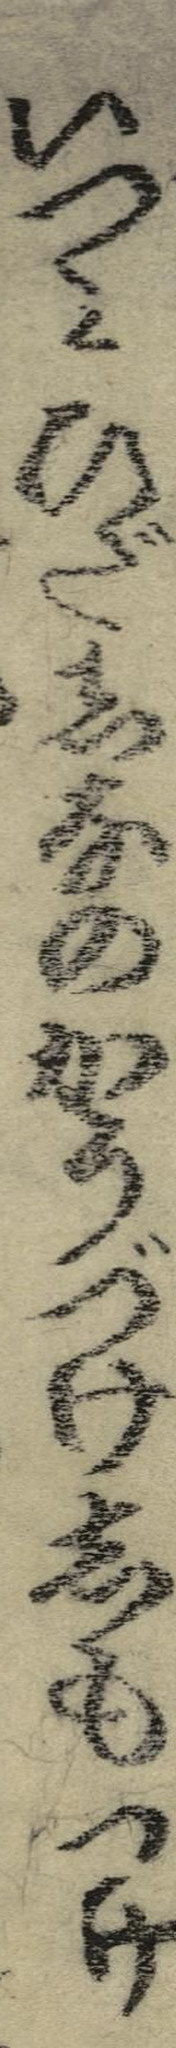いつひだしなのかうづけしもつけ小山
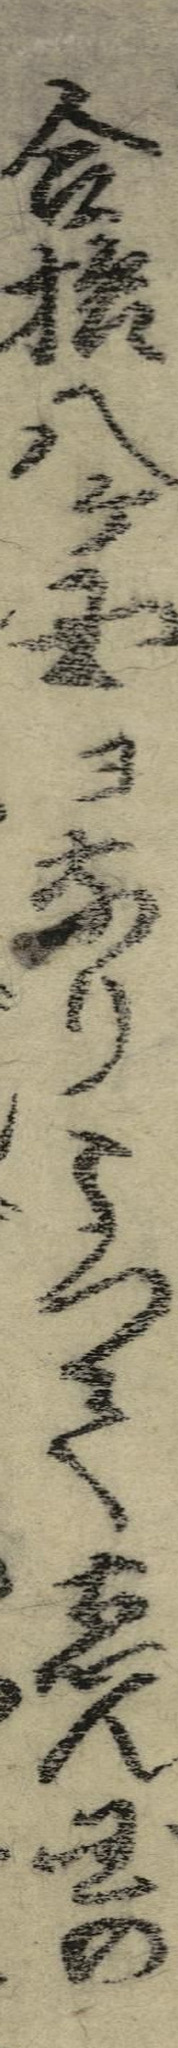合拾八ヶ国ヨなりよつてゑん国の
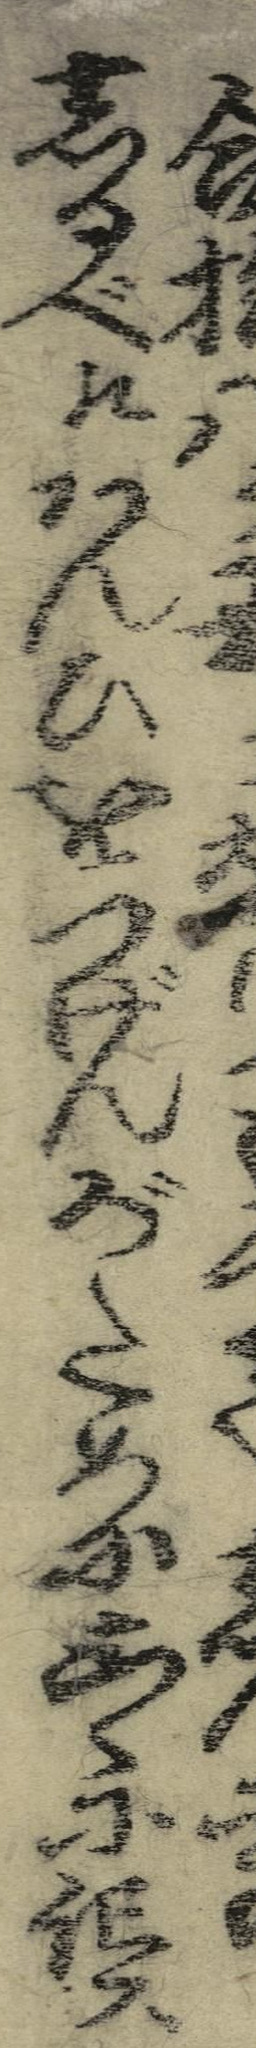しるべ江あんひをつげんがためにこゝに記ㇲ
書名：諸國大地震并大津浪
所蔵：東京大学地震研究所図書室 Earthquake Research Institute Library, The University of Tokyo, JAPAN
